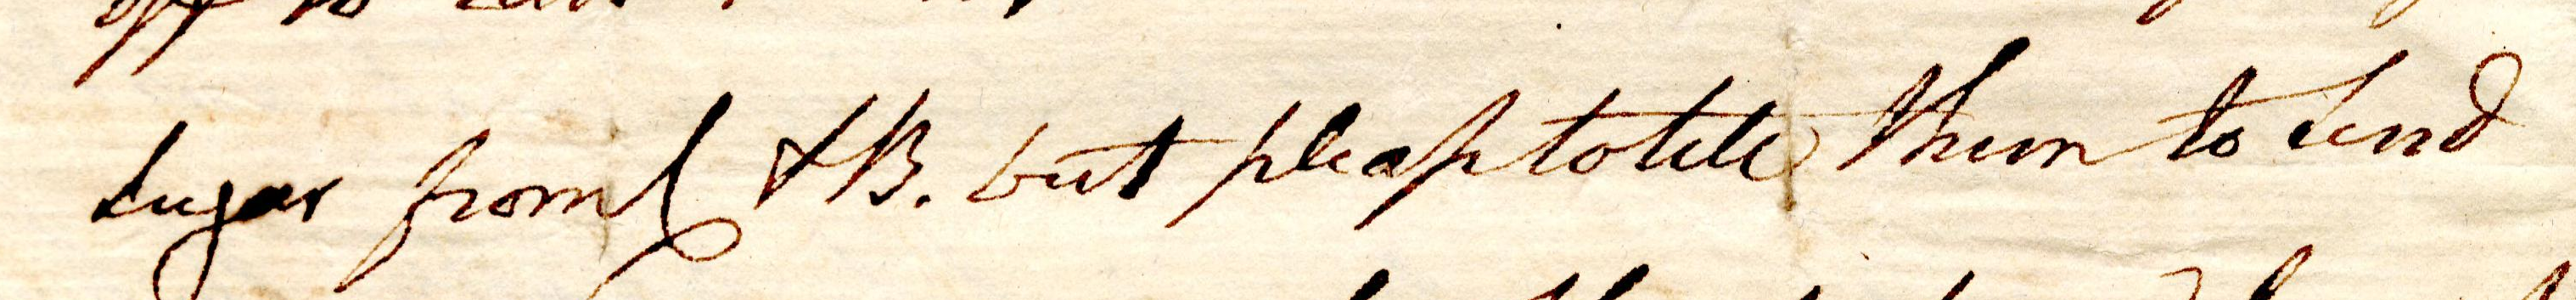sugas from C & B. but please to tell them to send
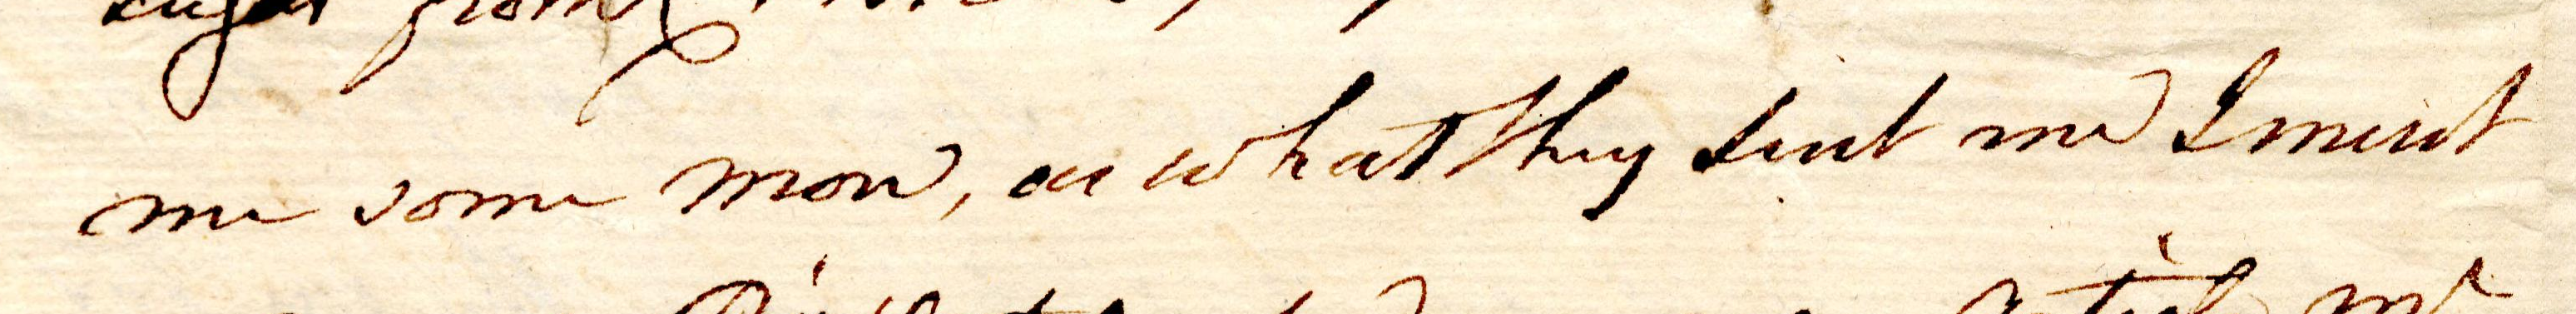me some more, as what they sent me I must
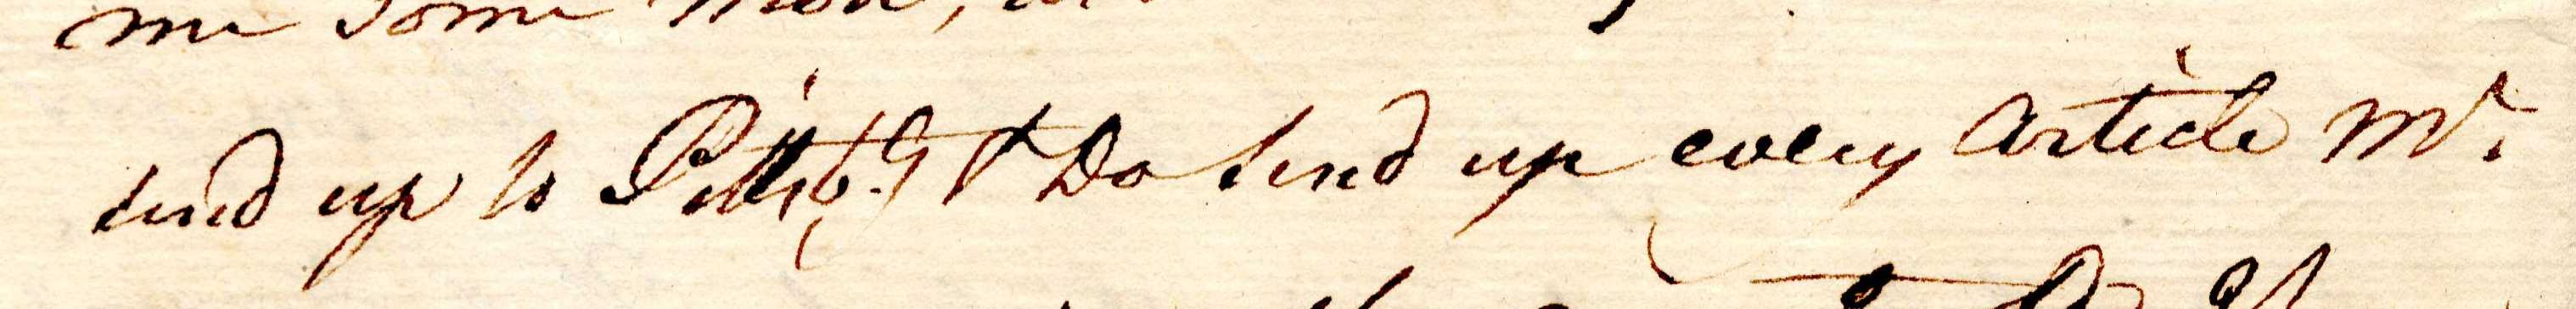send up to Pittsb^g & Do send up every Article M^r.
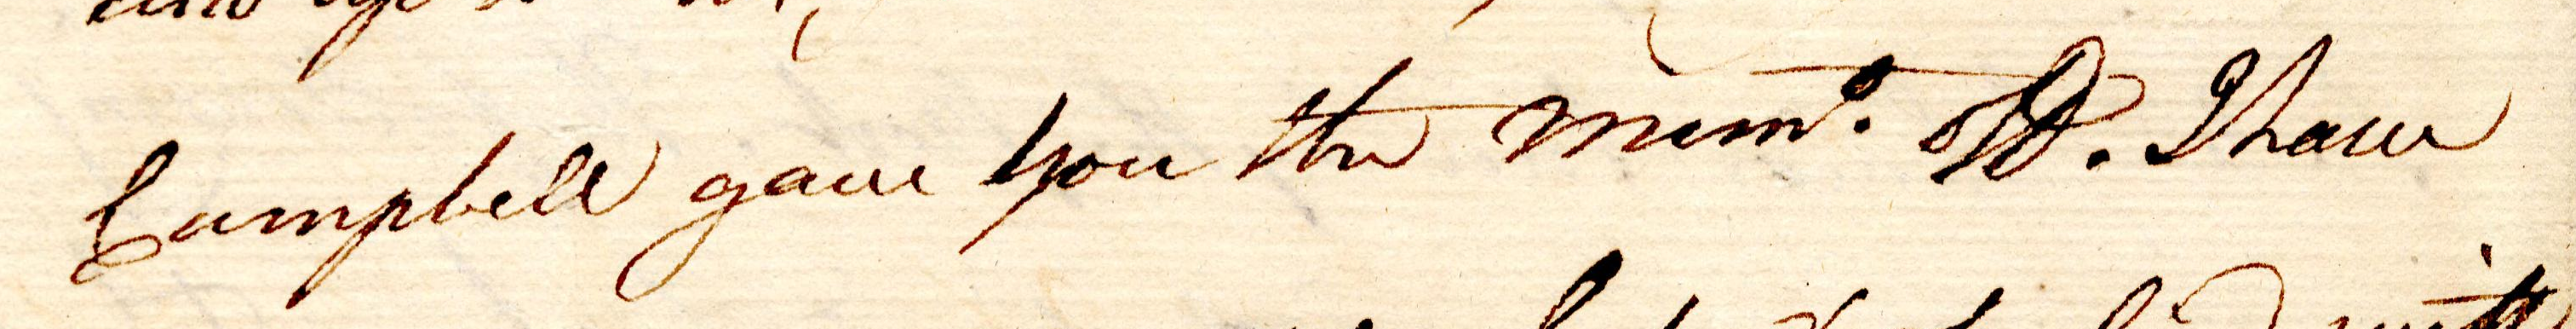Campbell gave You the mem^o. off. I have
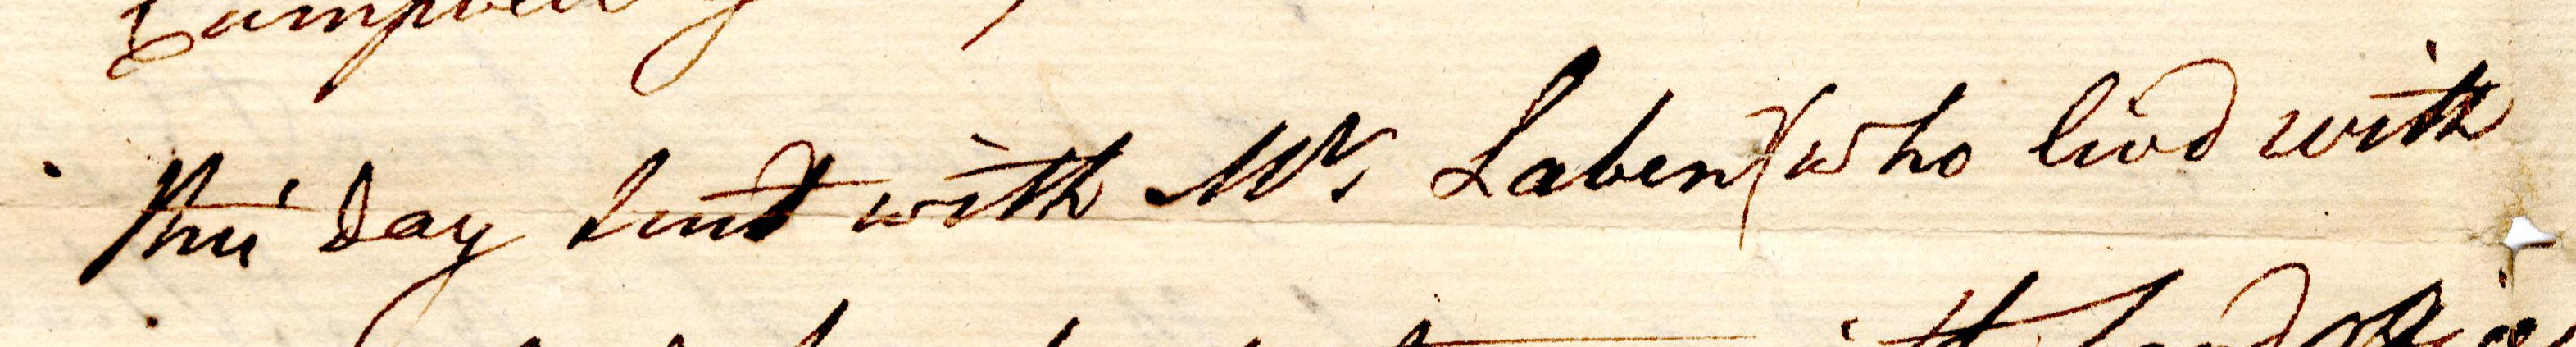this day sent with M^r. Laben (who livd with
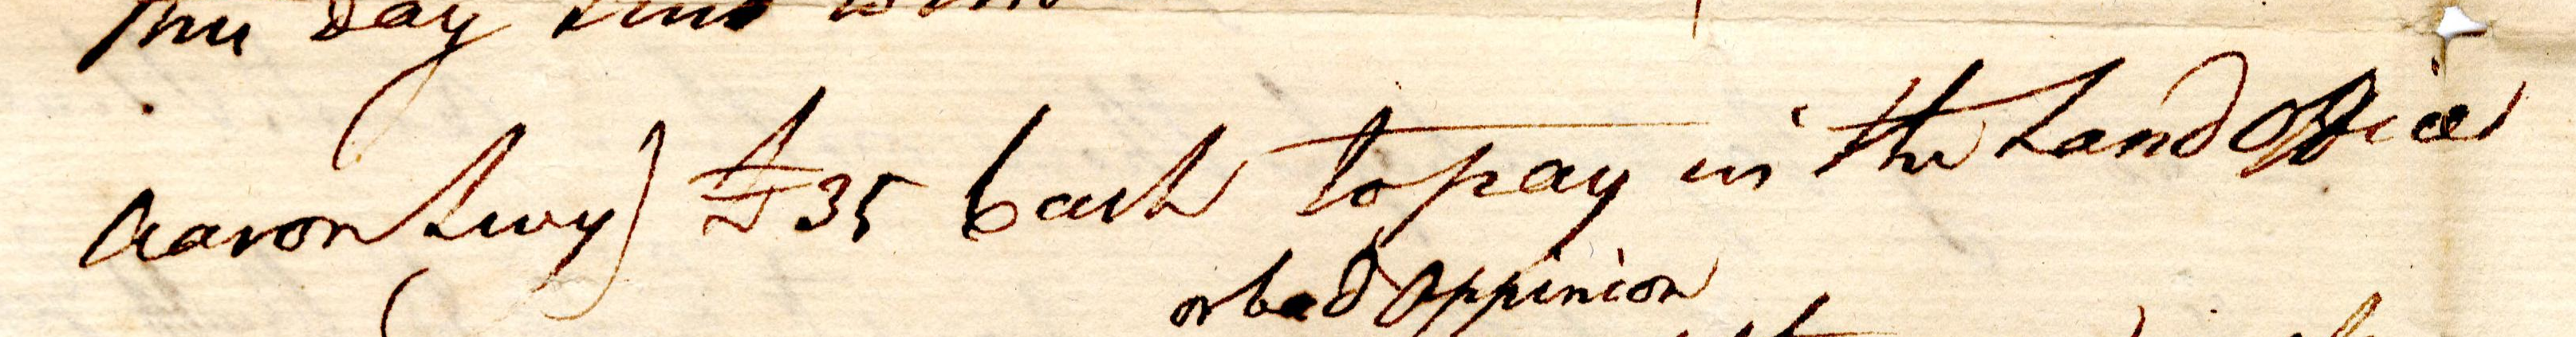Aaron Levy) £35 back to pay in the Land Office
